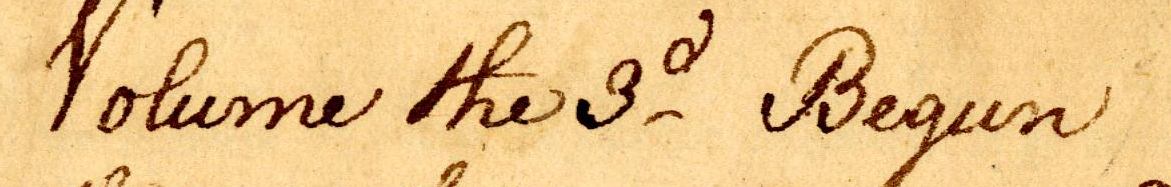Volume the 3^d Begun
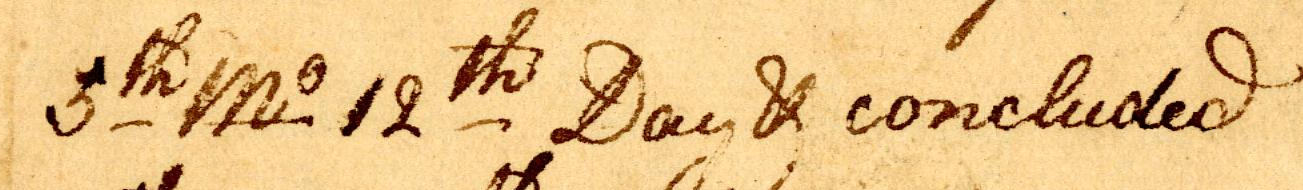5^th M^o 12^th Day & concluded
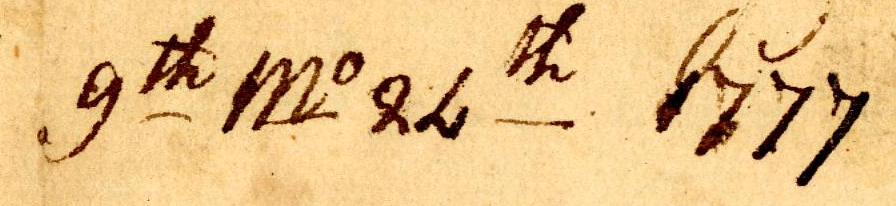9^th M^o 24^th 1777
